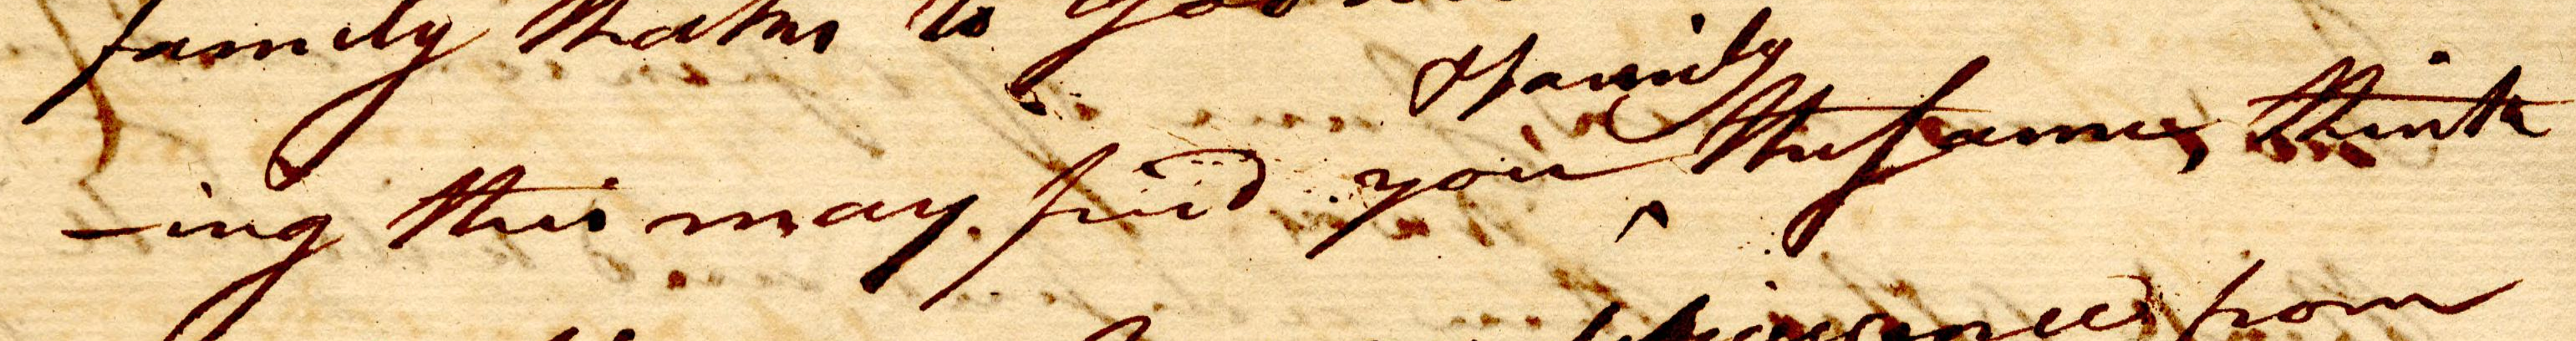-ing this may find you ^ the same think
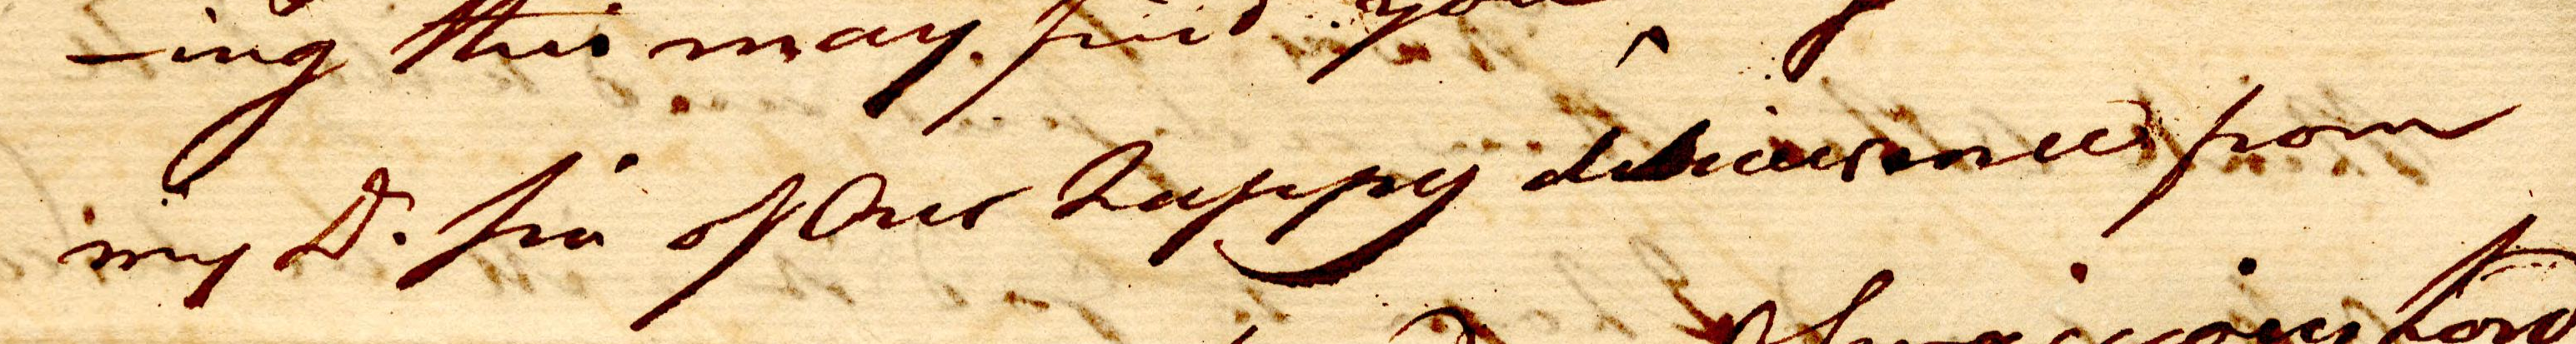my D. Sir of your happy difference from
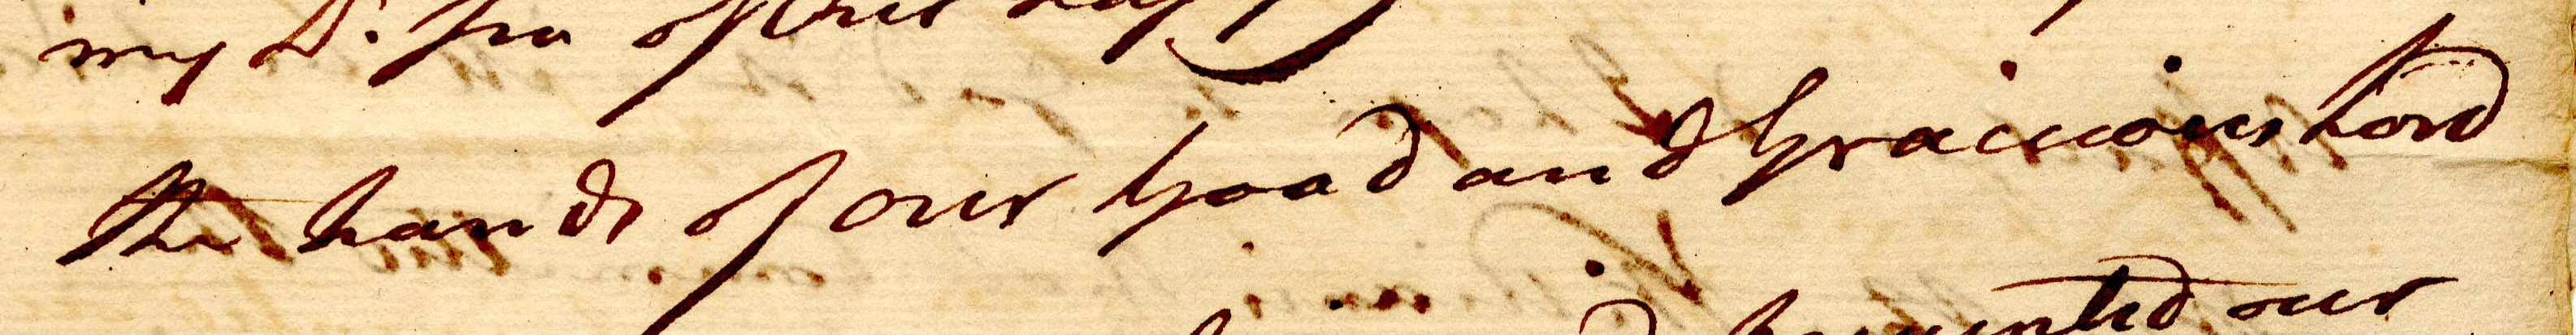the hands of our Good and Gracious Lord
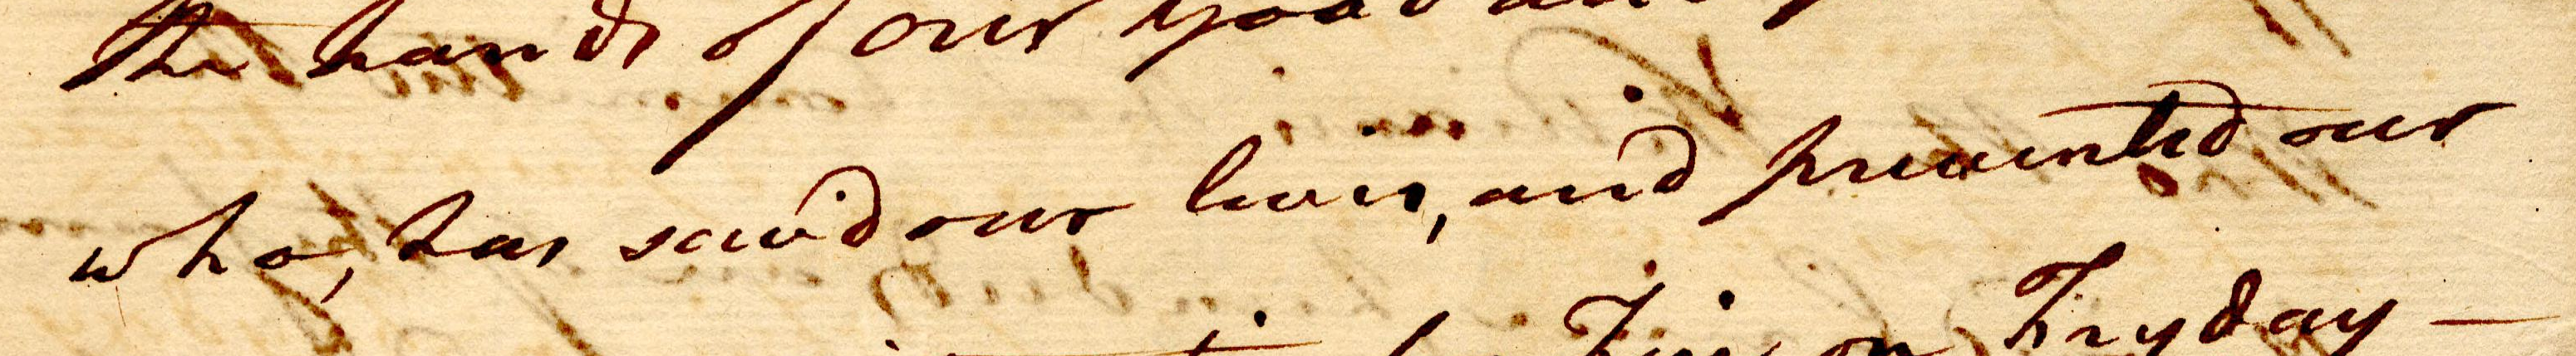who has sav'd our lives, and prevented our
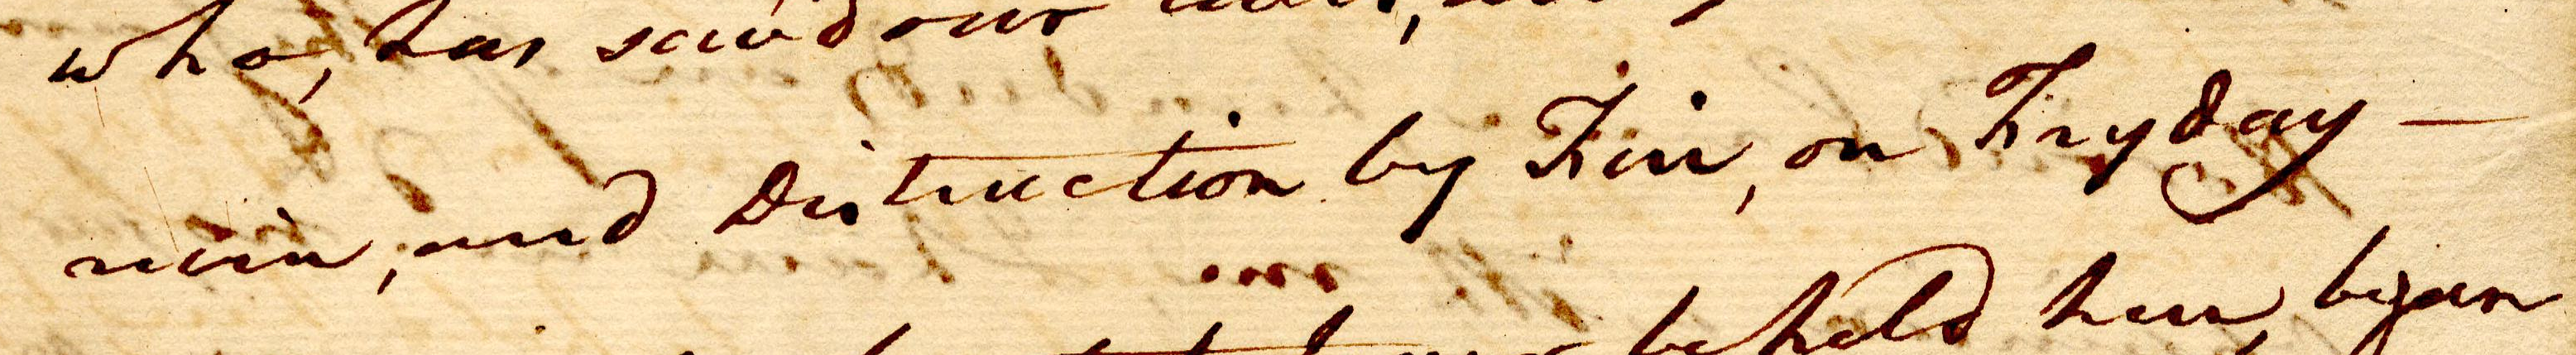ruin, and Destruction by Fire, on Fryday
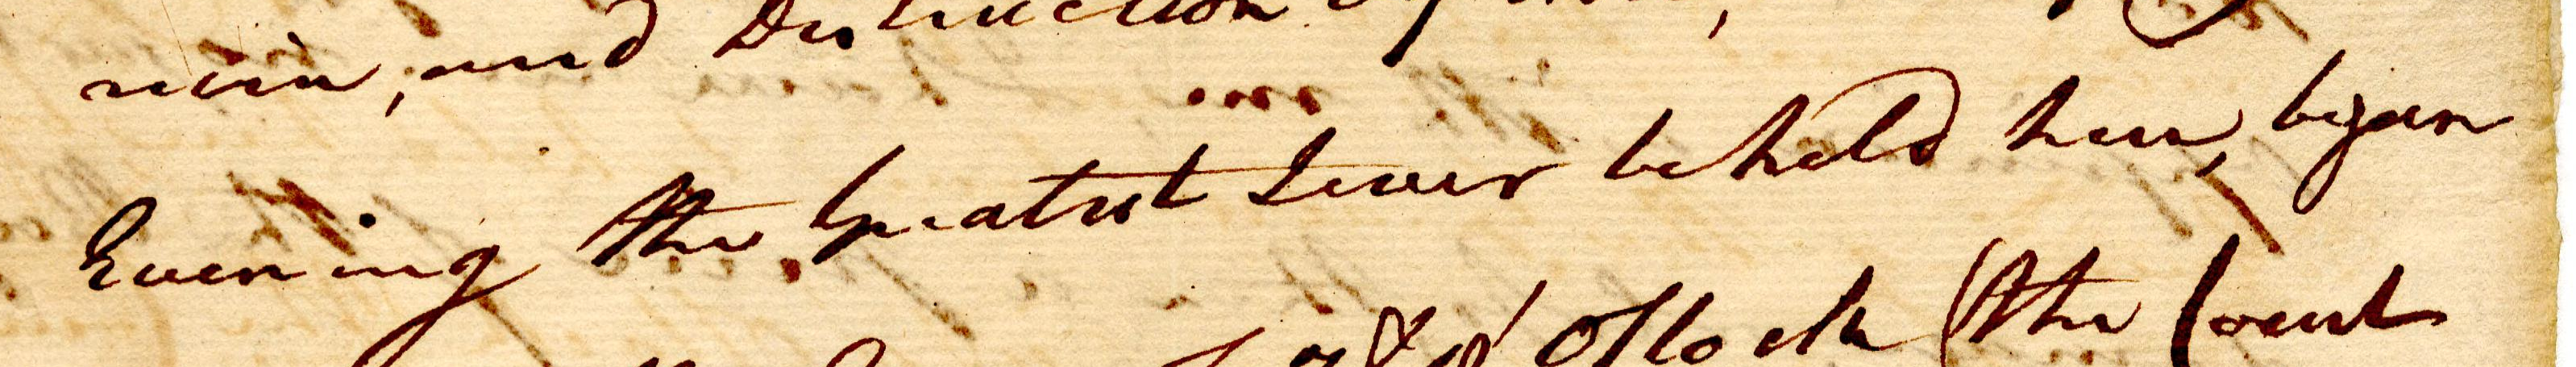Evening the greatest I ever beheld here, began
